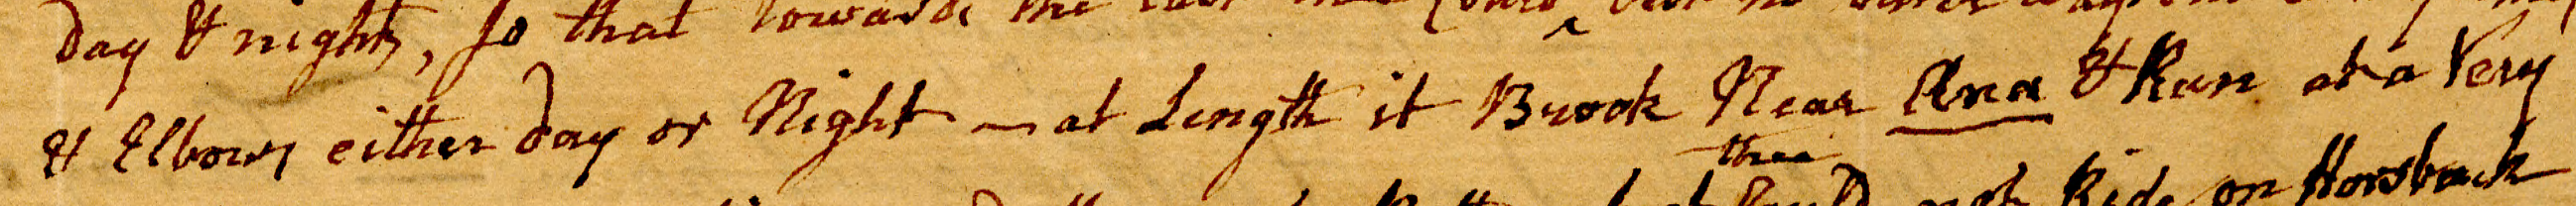& Elbows either day or night- at Length it Brook Near Ana & Reen at a Very
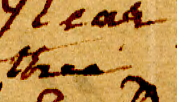thee
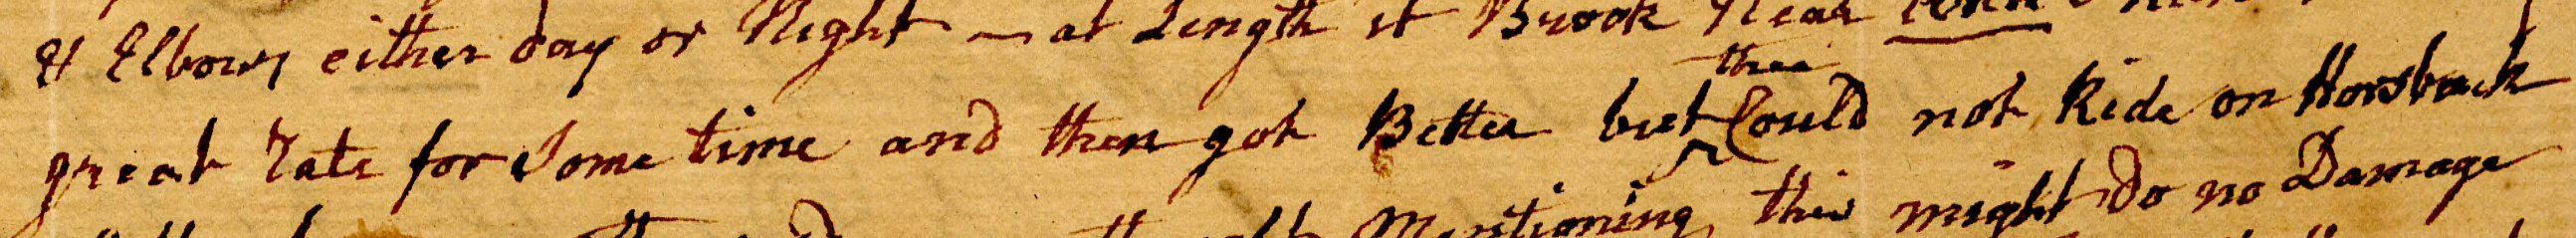great rate for some time and then got Better but ^ Could not ride on Horseback
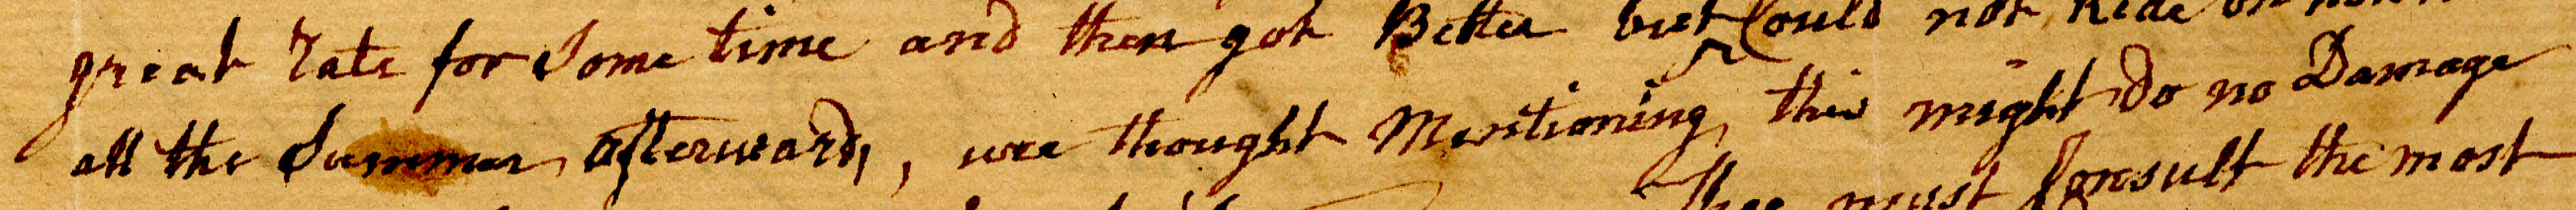all the Summer afterwards, wee thought Mentioning this might do no Damage
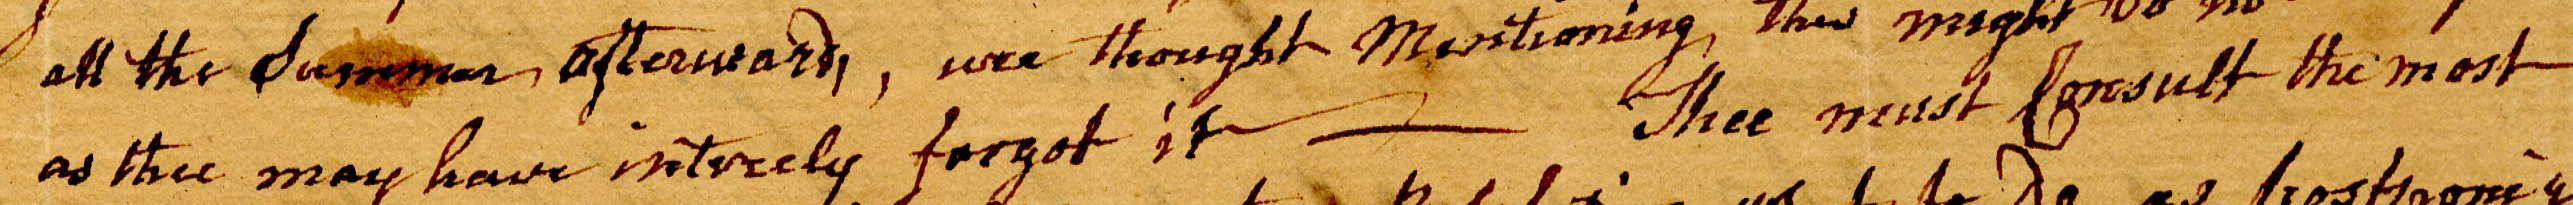as thee may have intirely forgot it- Thee must Consult the most
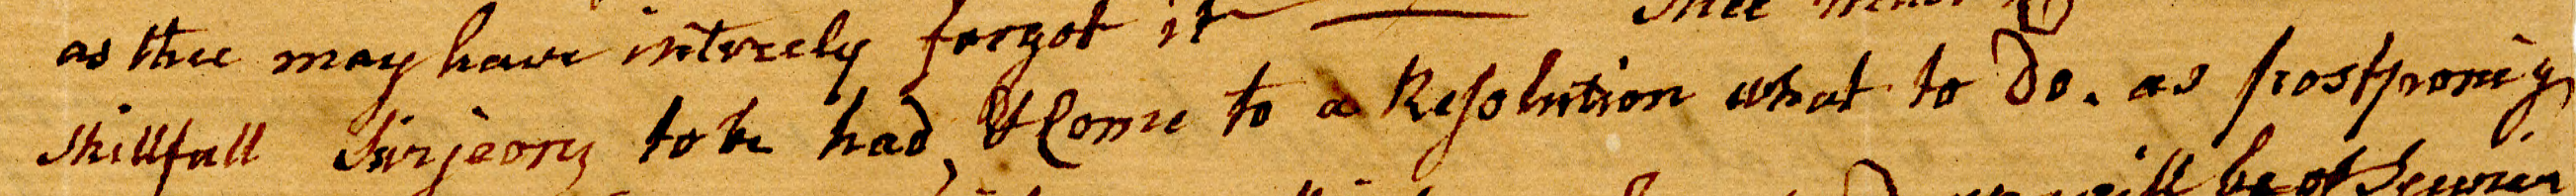skillfull Surjeory to be had, & Come to a Resolution what to do, as postponing
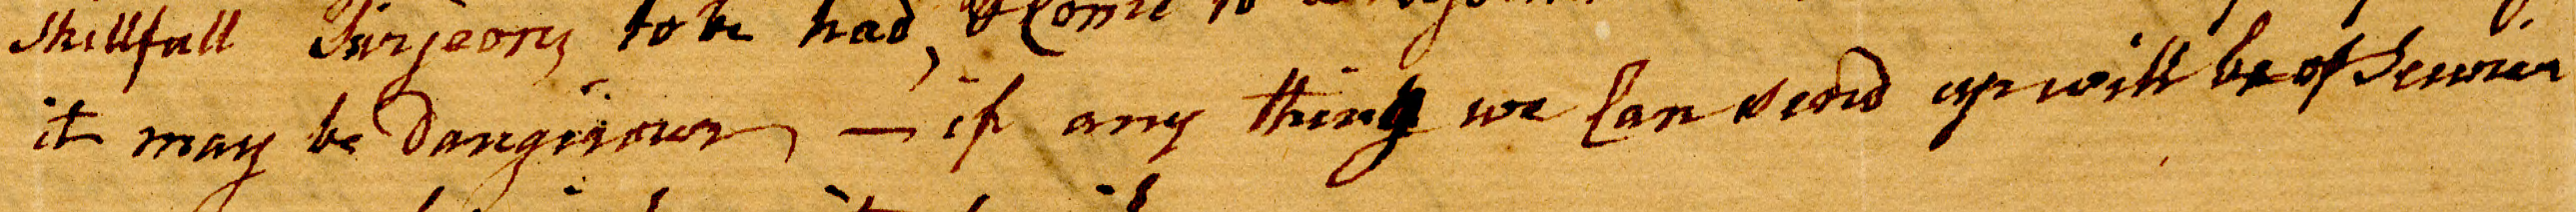it may be dangerous-if any thing we can send up will be of service
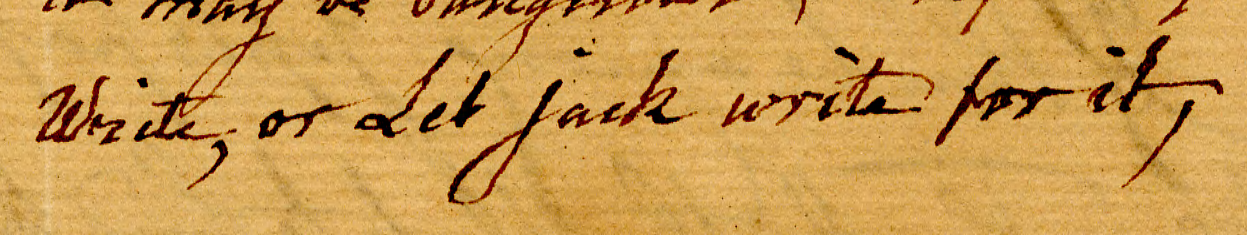write, or Let jack write for it
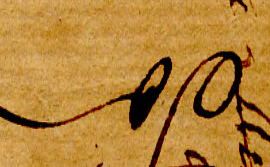To
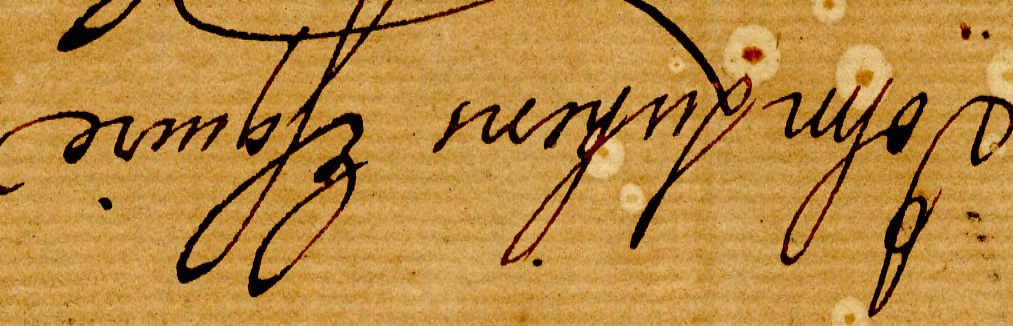John Lukens Esquire
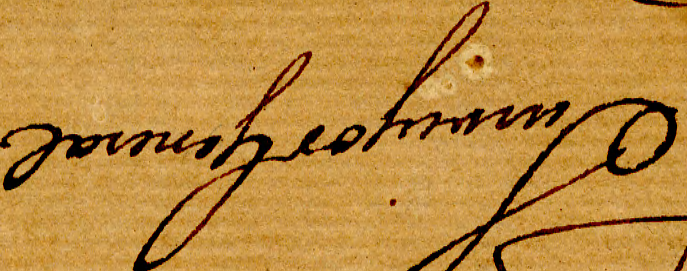Surveyor General
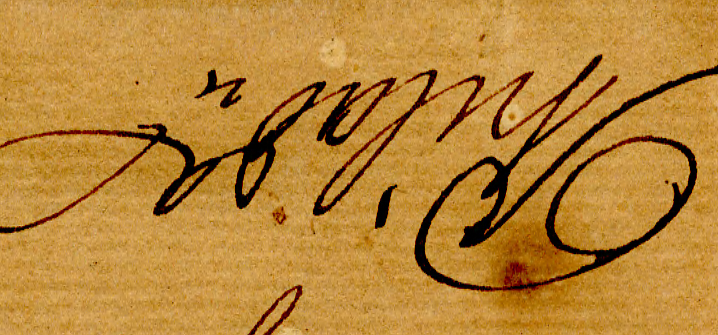Philad.^a
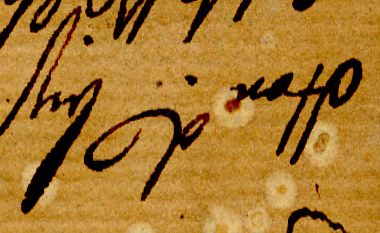Hon.^d by
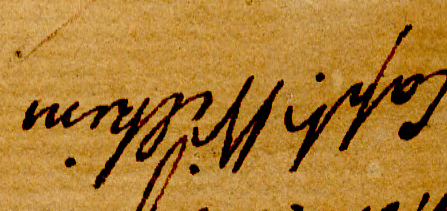Cap^n. Wilkins
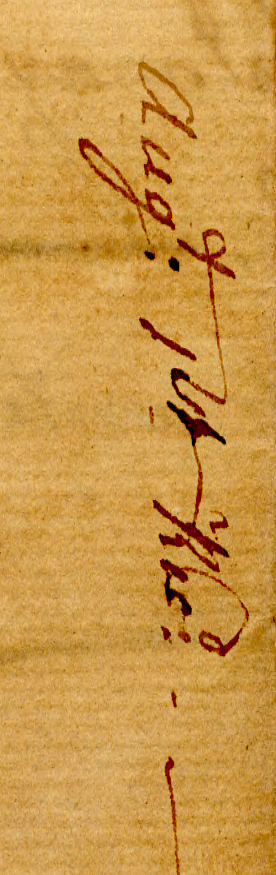Aug^t: 16^th Rec^d:-
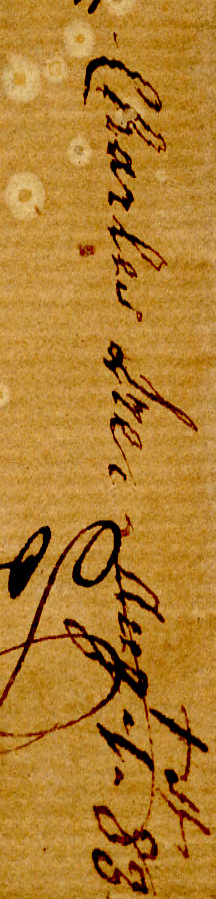Charles Lre. Aug^t. ./. 83
